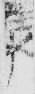集
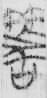箸（書）
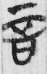言
